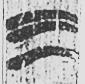三
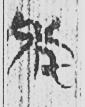年
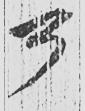乃
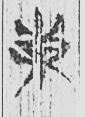東
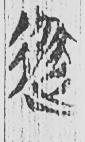{辶𡱵}
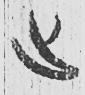止
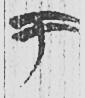于
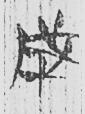成
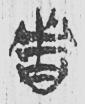周
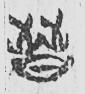晉
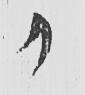人
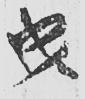𡚦
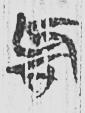{㠯ㅋ}
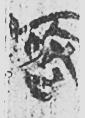啟
